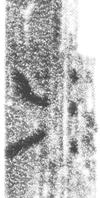此
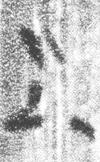之
